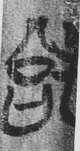○（凡）
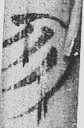勿（物）
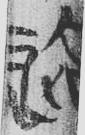流
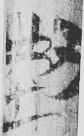型（形）
